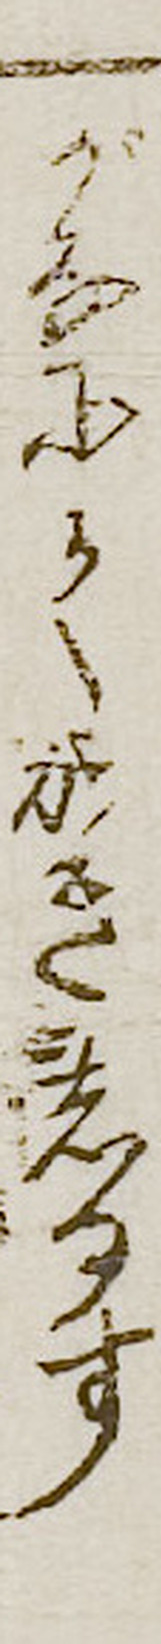がなにてかきしるす
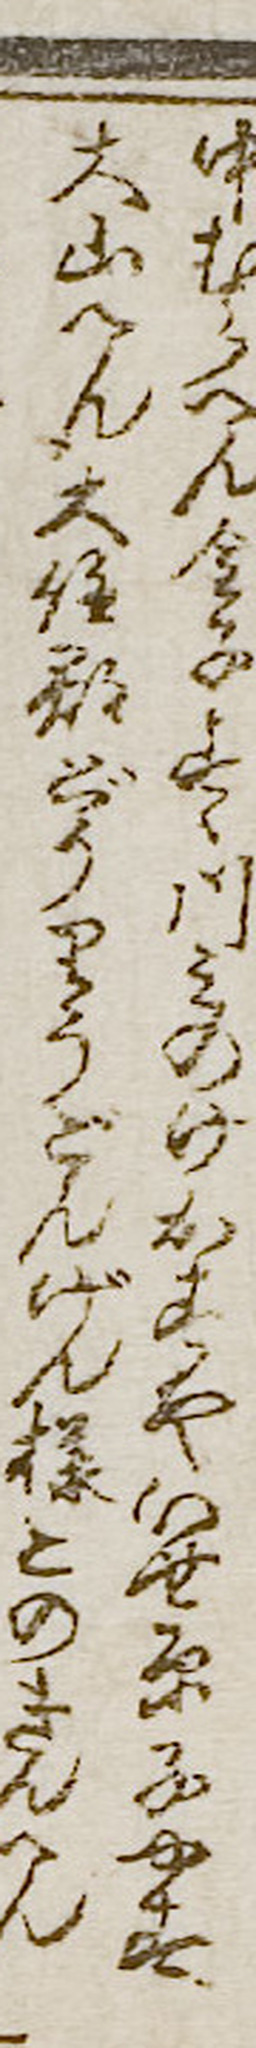大山へん大住郡どうりうごんげん様このきんへん
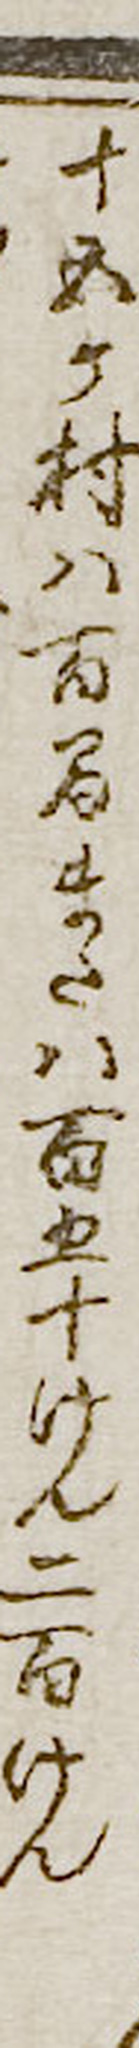十五ヶ村は百間または百五十けん二百けん
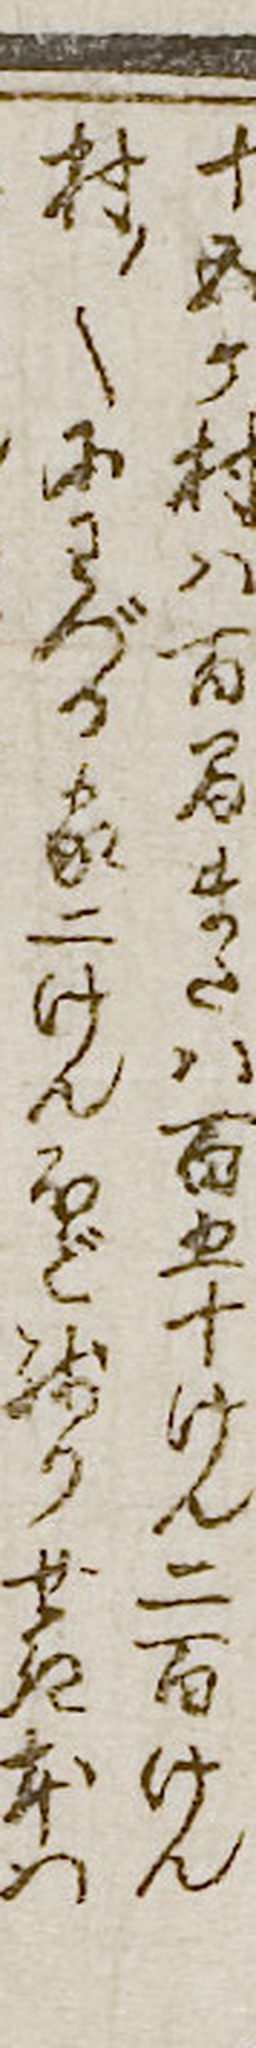村〳〵にわづか家二けんほど残りせき本は
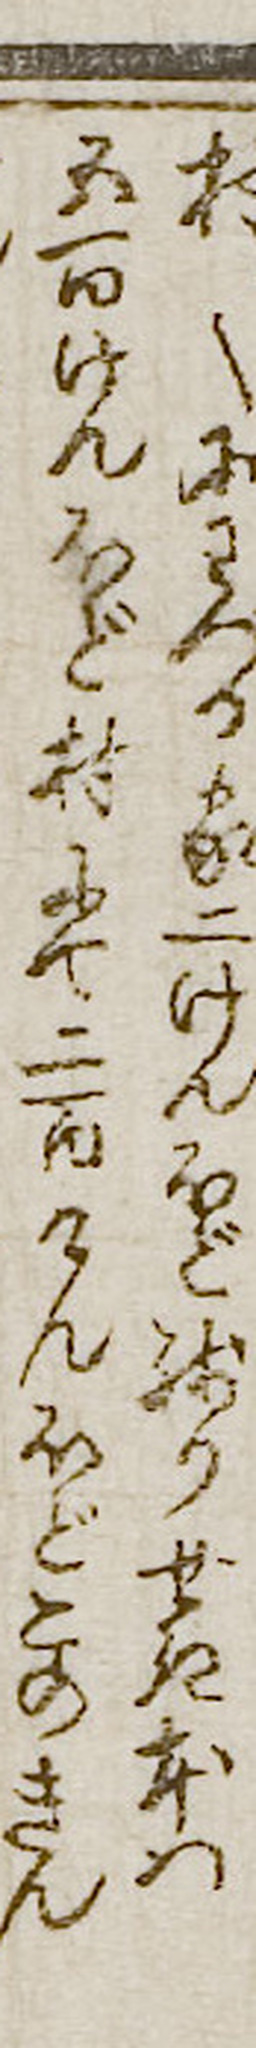五百けんほど村にて二百けんほどこのきん
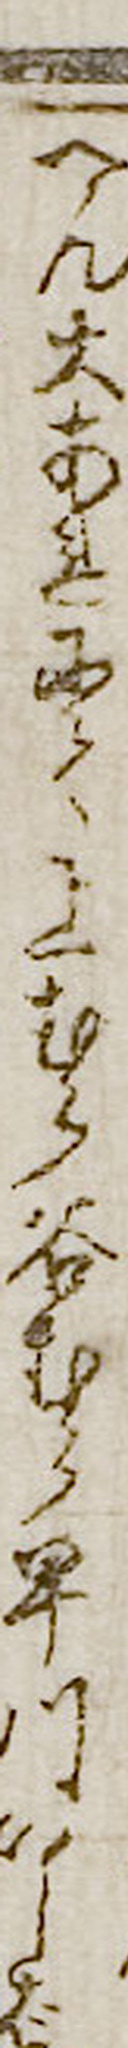へん大あれにて上むら谷むら早川いしばし山
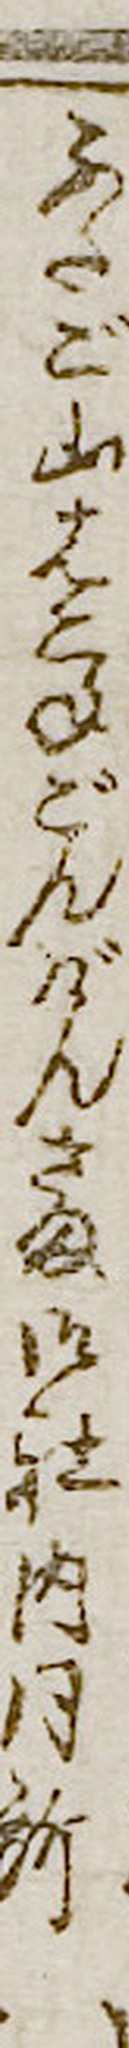ふたご山はこねごんげんさま御社内同所
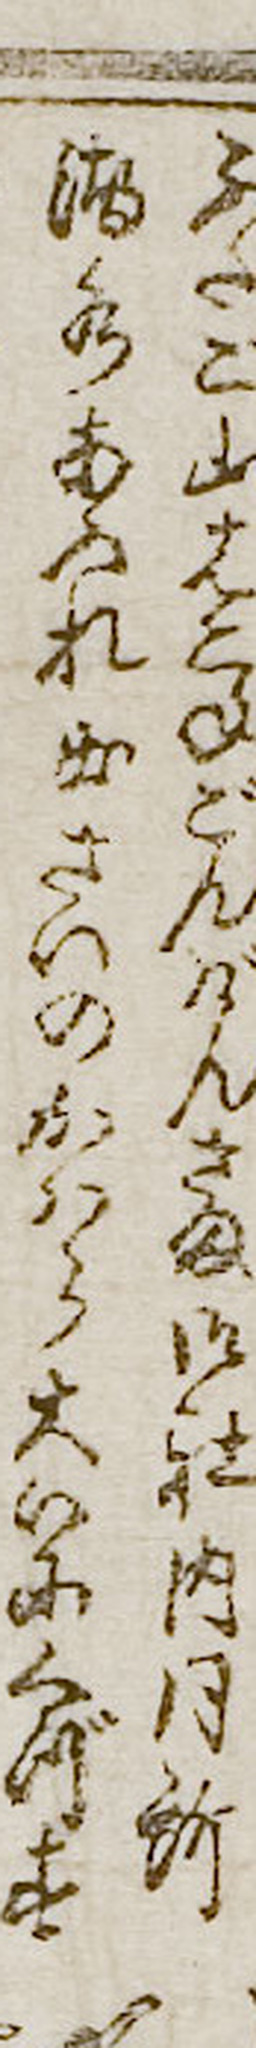海水あふれ出さいのかはら大いにくづす
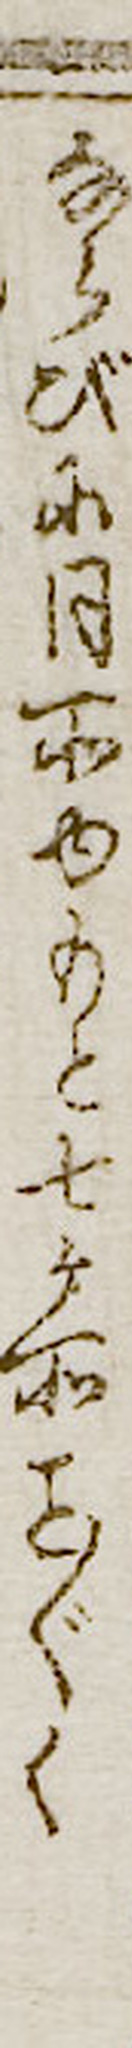ならびに同所ゆもと七ヶ所こと〴〵く
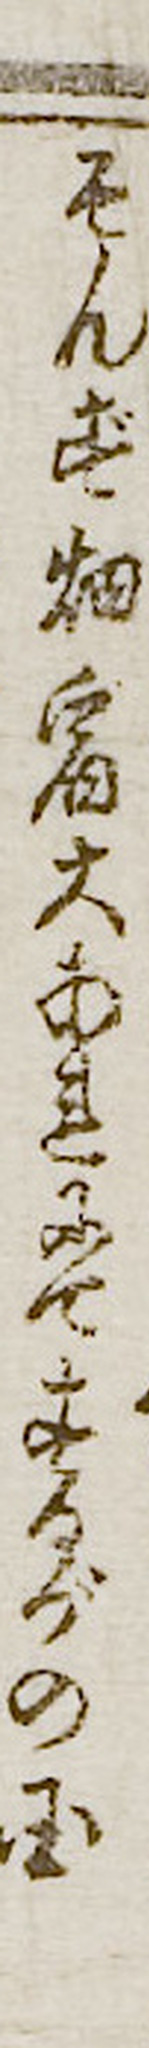そんず畑宿大あれにてするがの国
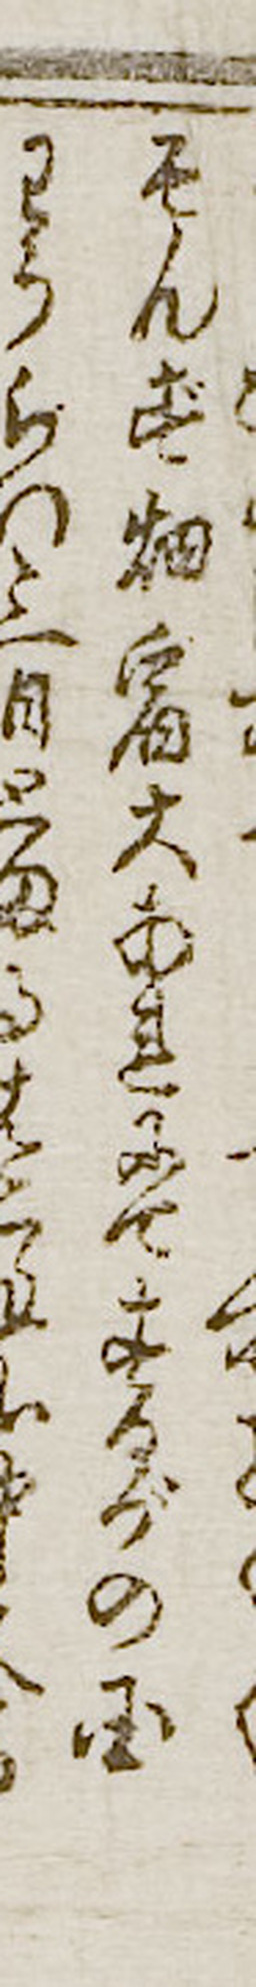わうらい三日とまるはこね山中人馬
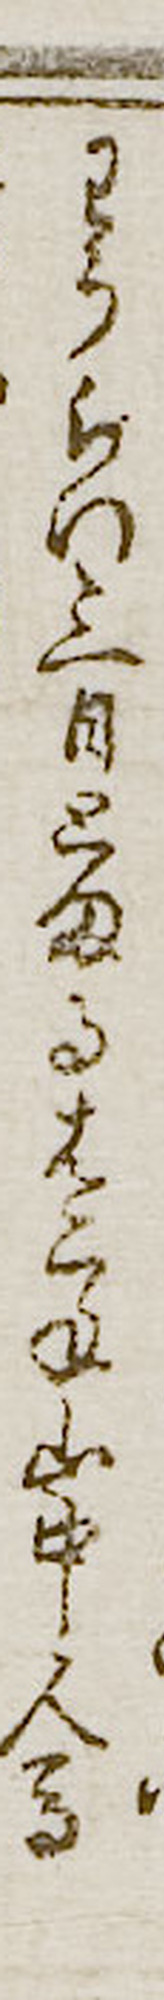わうらい三日とまるはこね山中人馬
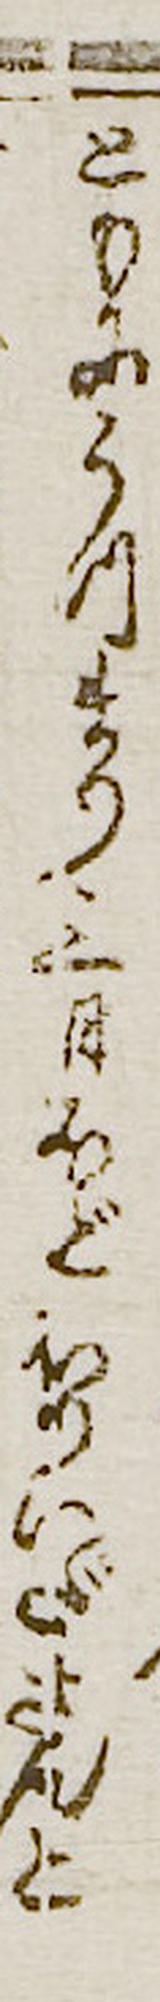ともにうつまり三日ほどほりいださんと
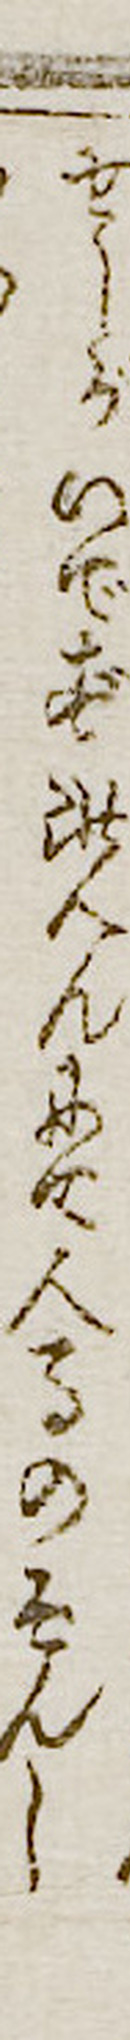せしがいでず此へんにて人馬のそんし
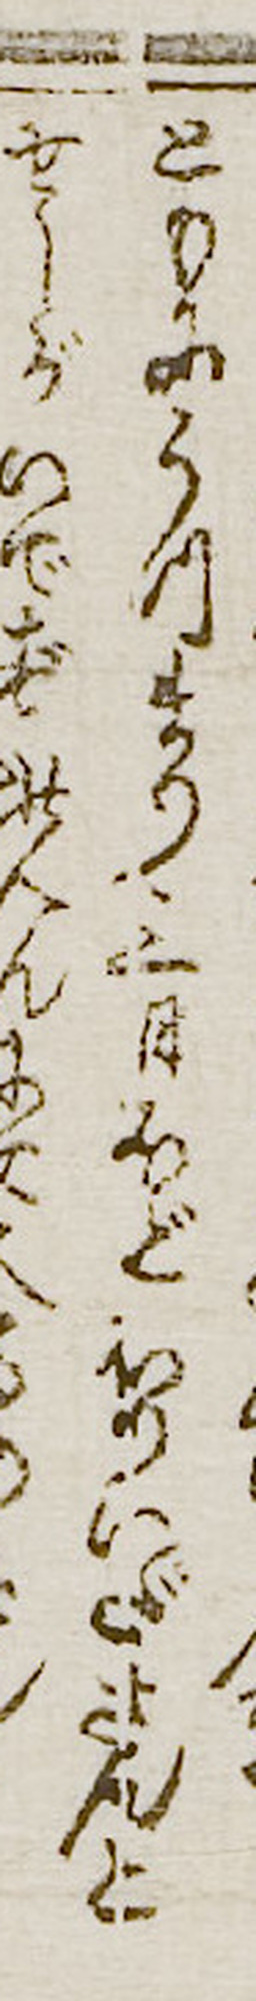せしがいでず此へんにて人馬のそんし
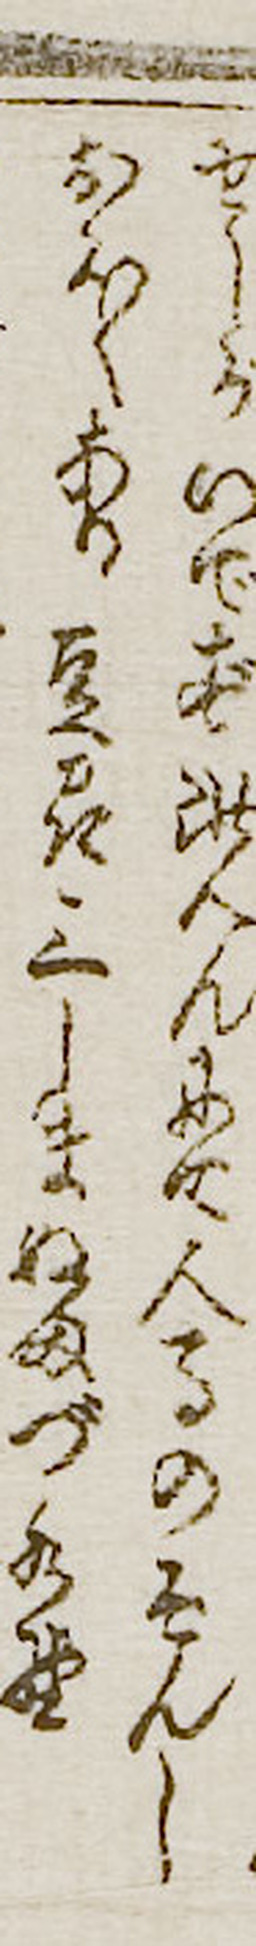おほくあり豆州三しまぬまづ水野
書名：伊豆下田小田原箱根大地震之図
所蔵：東京大学総合図書館 General Library in the University of Tokyo, JAPAN
